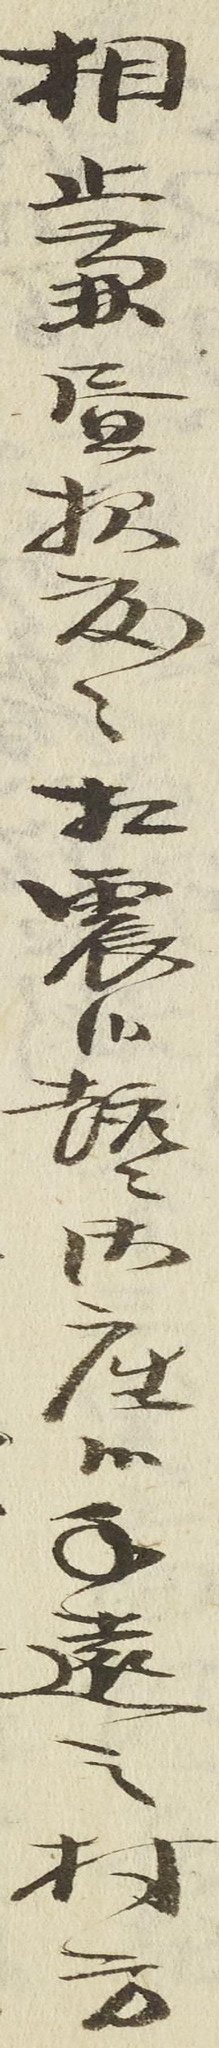相止兼昼夜度々相震候趣二御座候手遠之村方
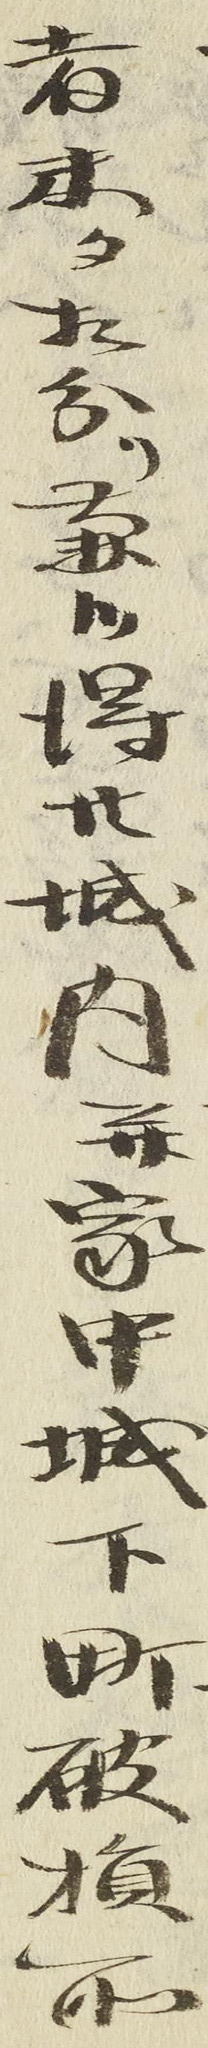は未相タ相分り兼候得共城内并家中城下町破損所
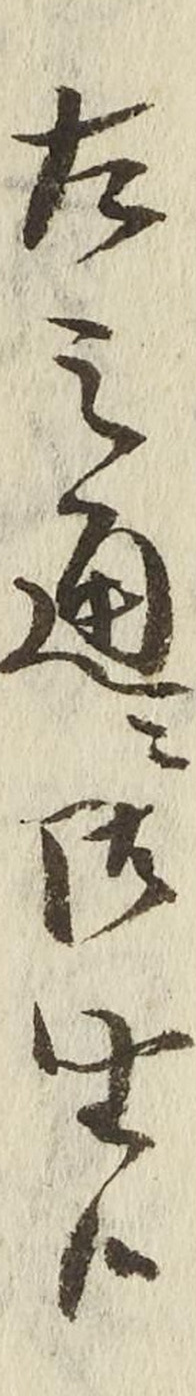左之通二御坐候
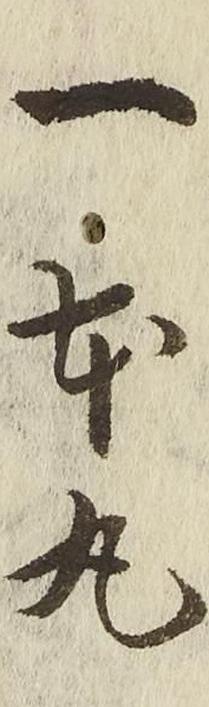一本丸
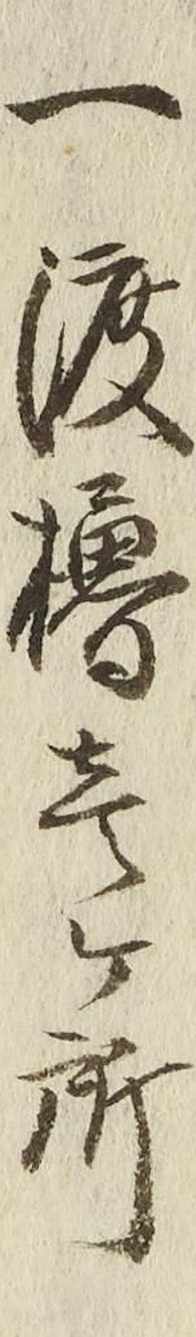一渡櫓壱ヶ所潰
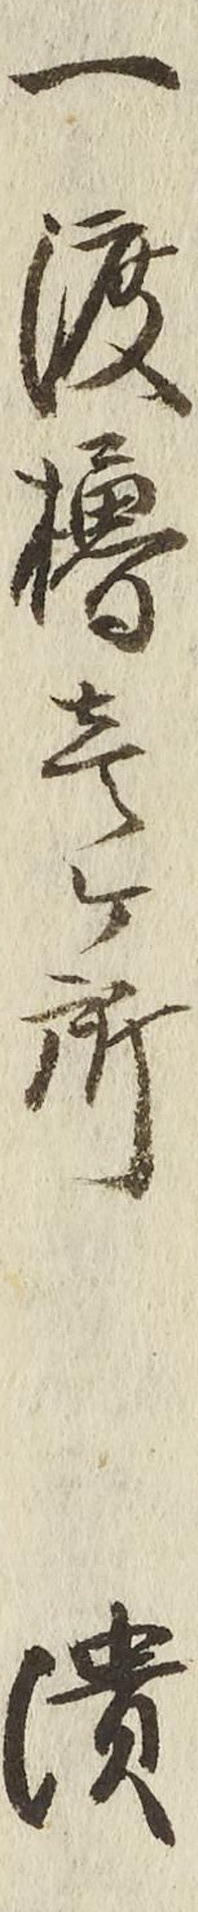一渡櫓壱ヶ所潰
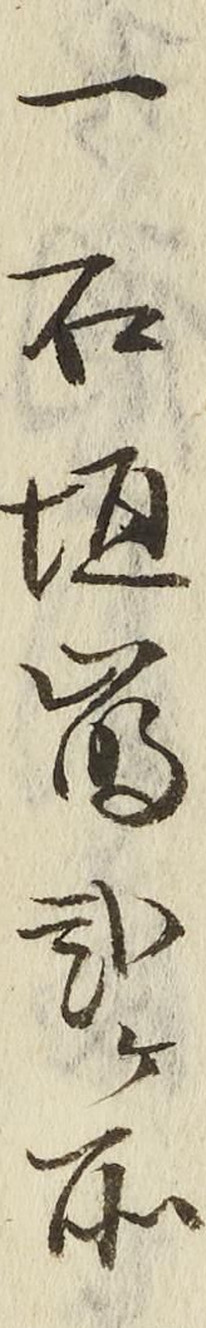一石垣崩弐ヶ所
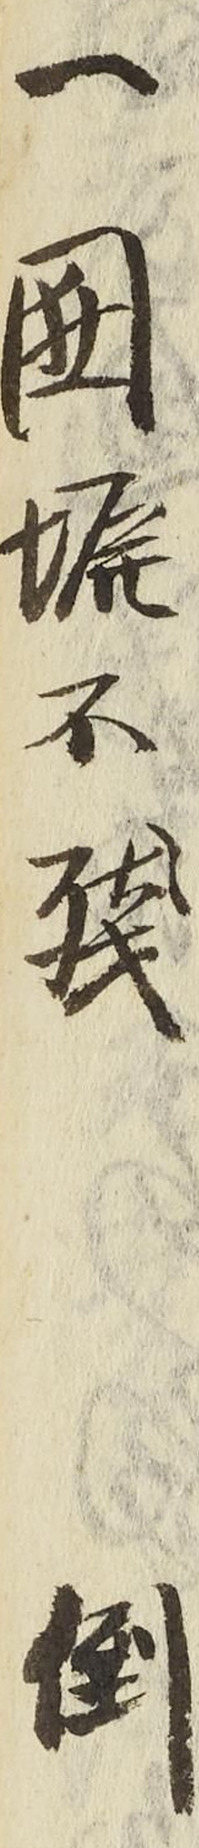一囲塀不残倒
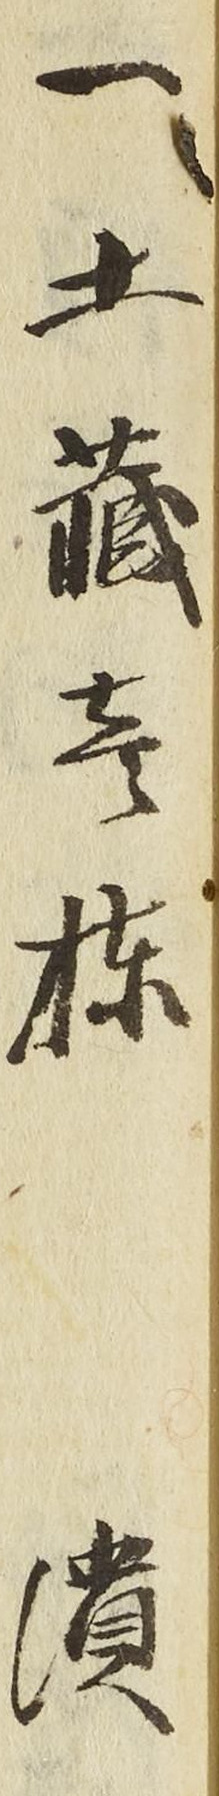一土蔵壱棟潰
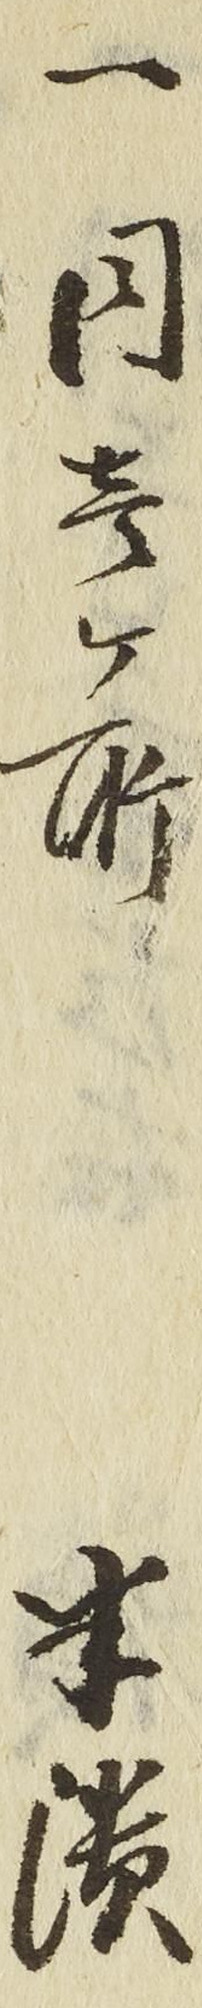一同壱ヶ所半潰
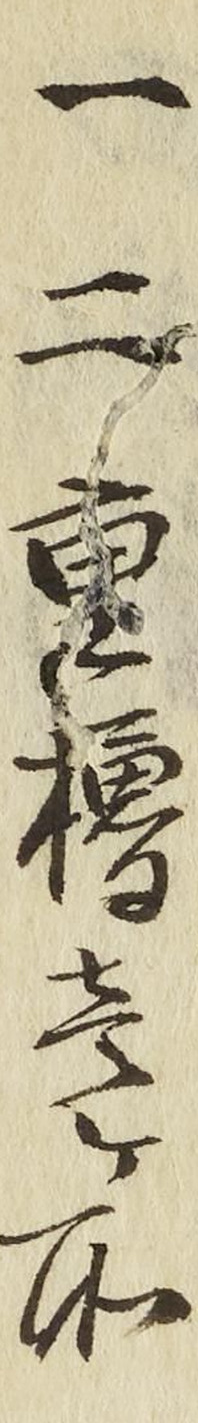一二重櫓壱ヶ所潰
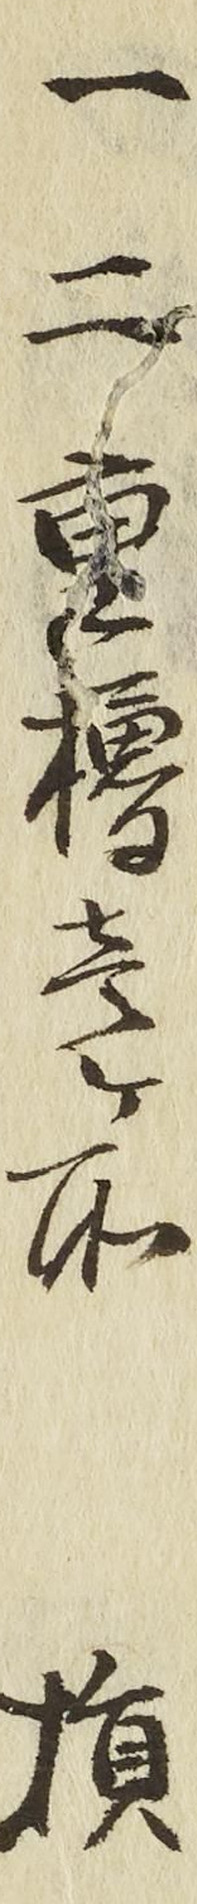一二重櫓壱ヶ所潰
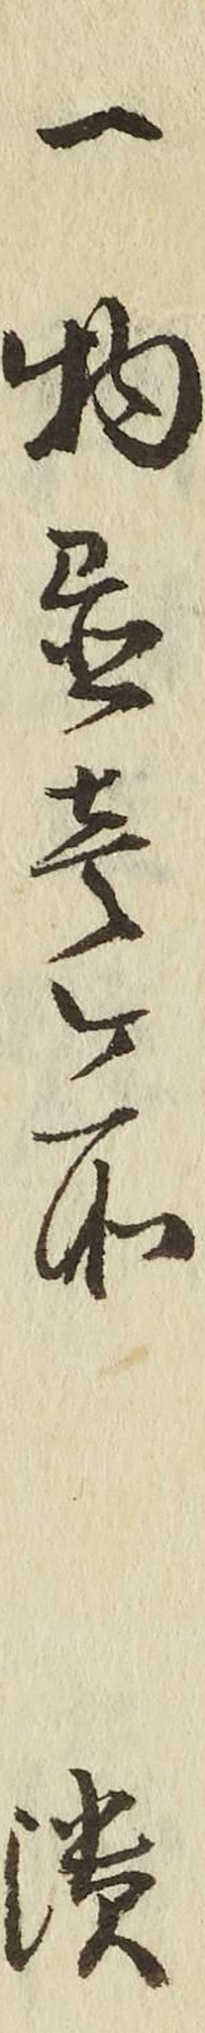一物置壱ヶ所潰
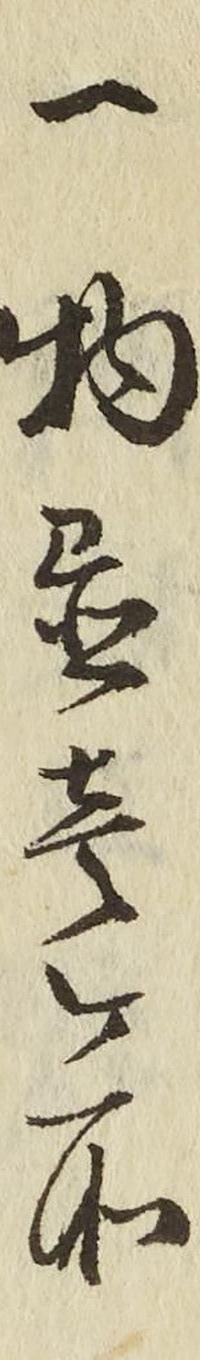一物置壱ヶ所潰
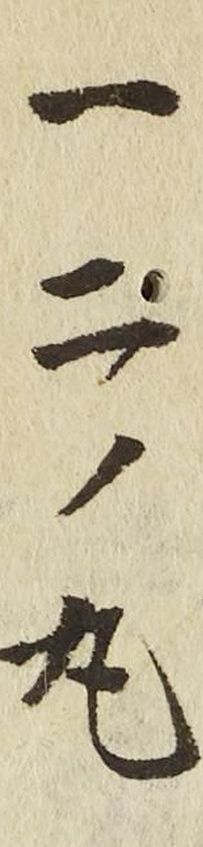一二ノ丸
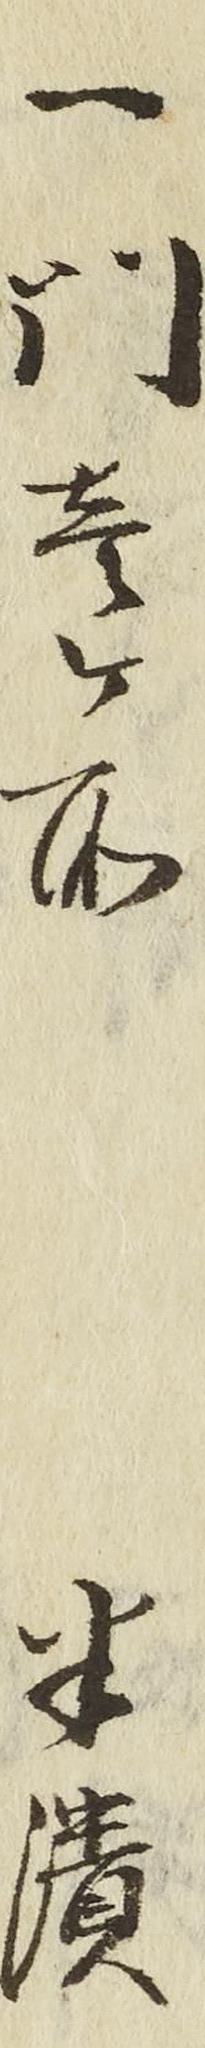一門壱ヶ所半潰
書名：信濃國大地震記　乾
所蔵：東京大学地震研究所図書室 Earthquake Research Institute Library, The University of Tokyo, JAPAN
